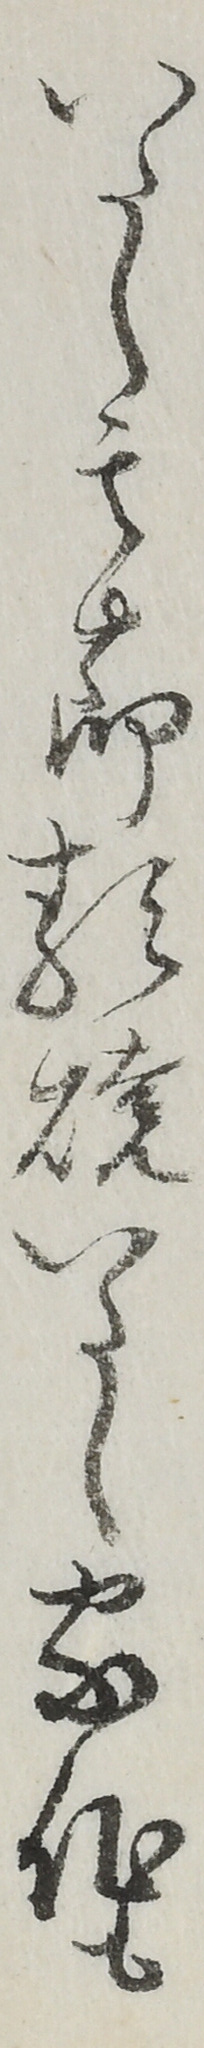いたし其節類焼いたし家作も
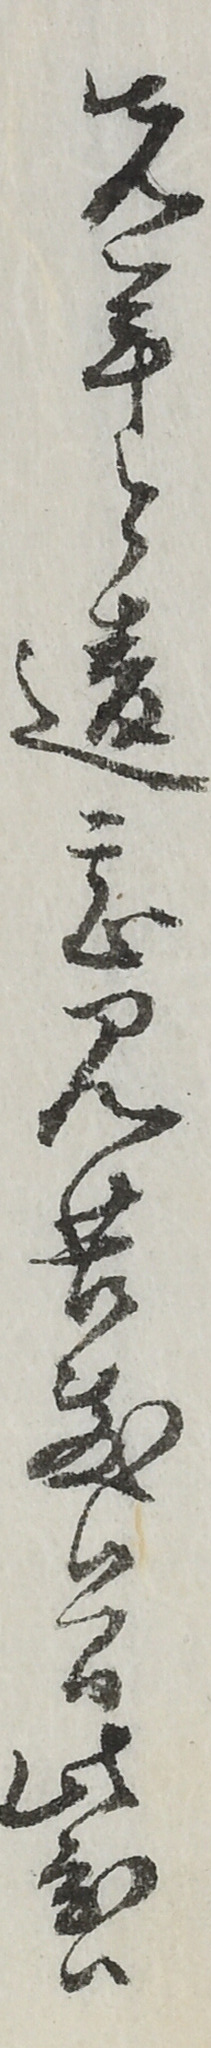先年令違甚見苦敷候間此度ハ
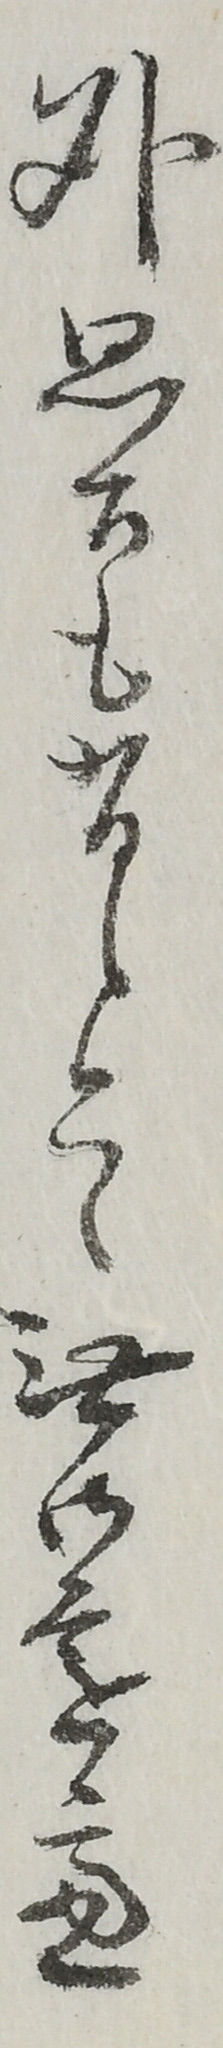外思にも有之候ハゞ無御遠慮
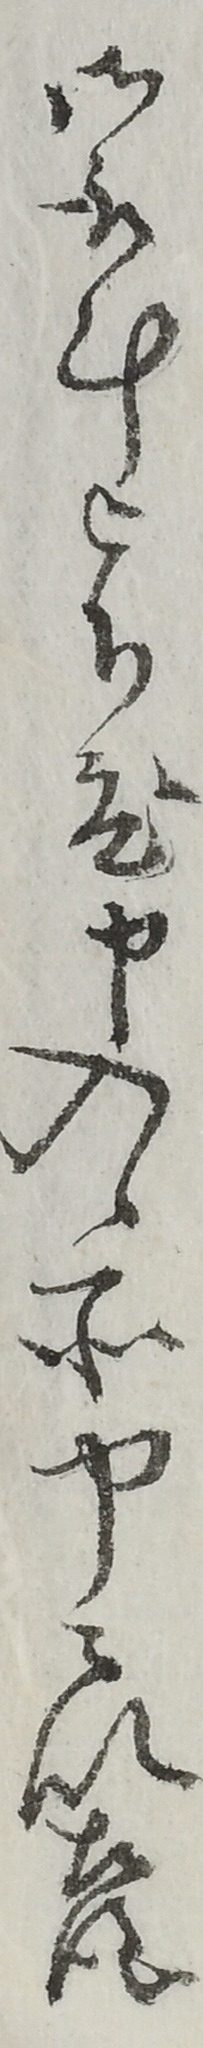御取斗被下度申入候所申ニ以左様

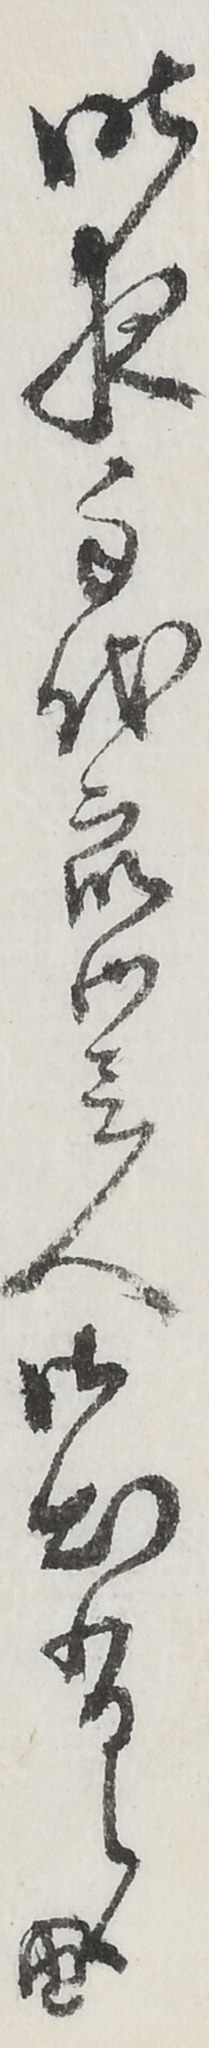昨夜手代衆御壱人御出有之候由
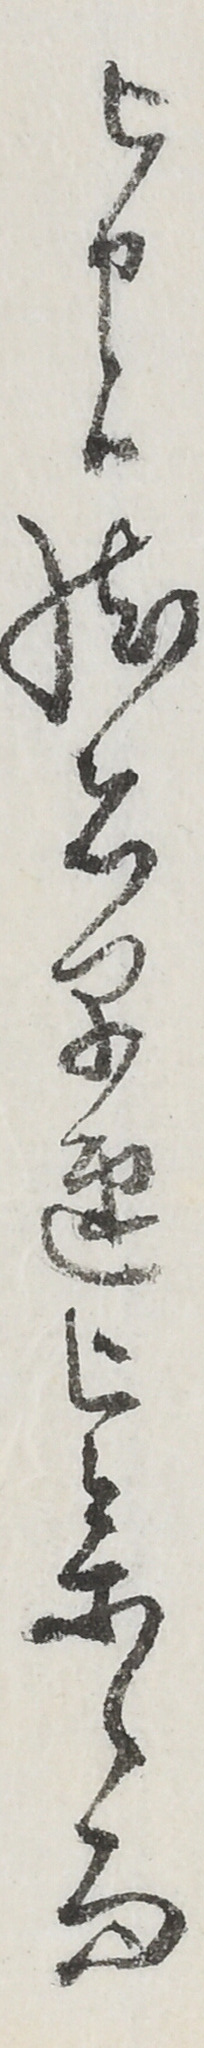被申候然者早速被参候而
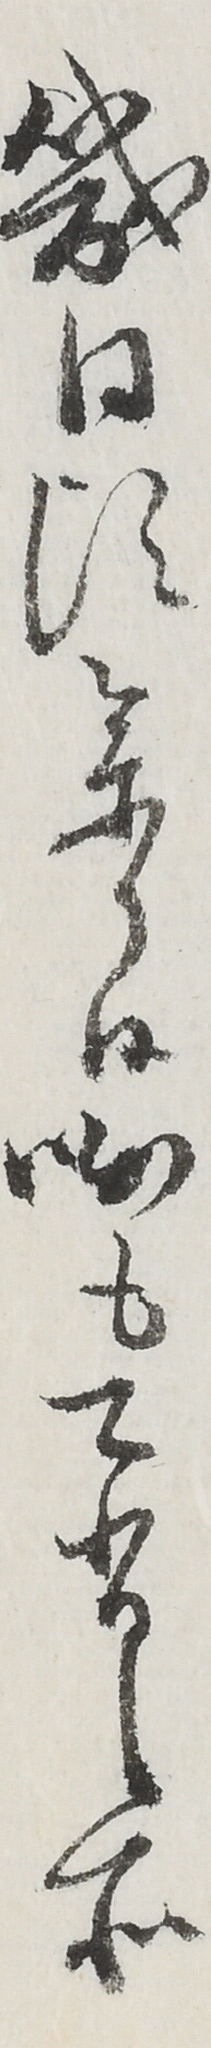幾日頃参リ候咄も可有之所
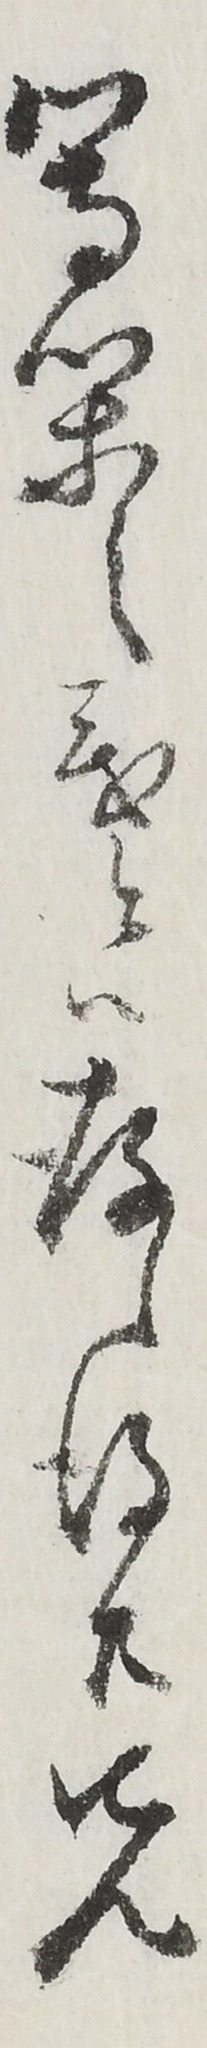等閑之義候ニハ存候得共先
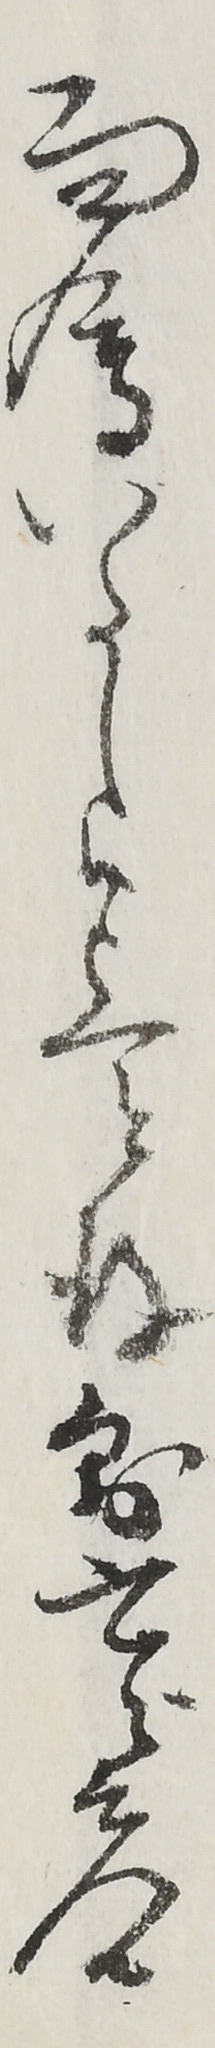面会いたし候上者存歟六郎太衛門殿
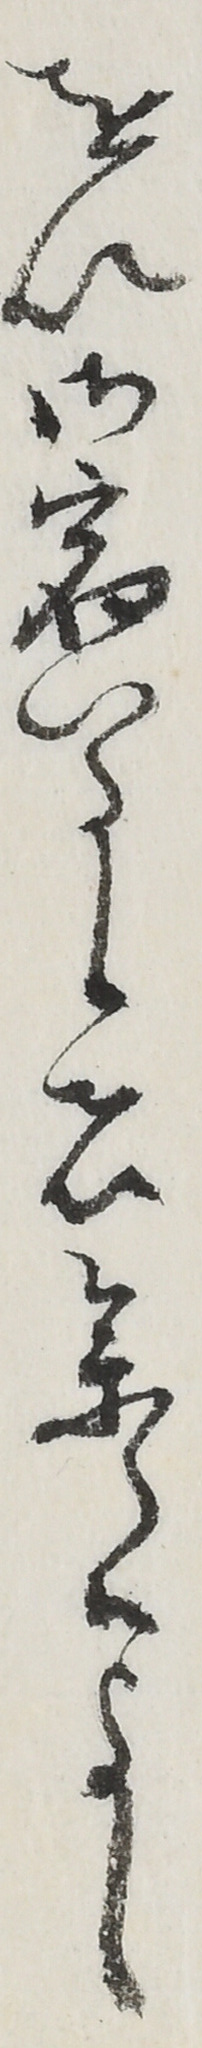を以御宿いたし候者参り候よし
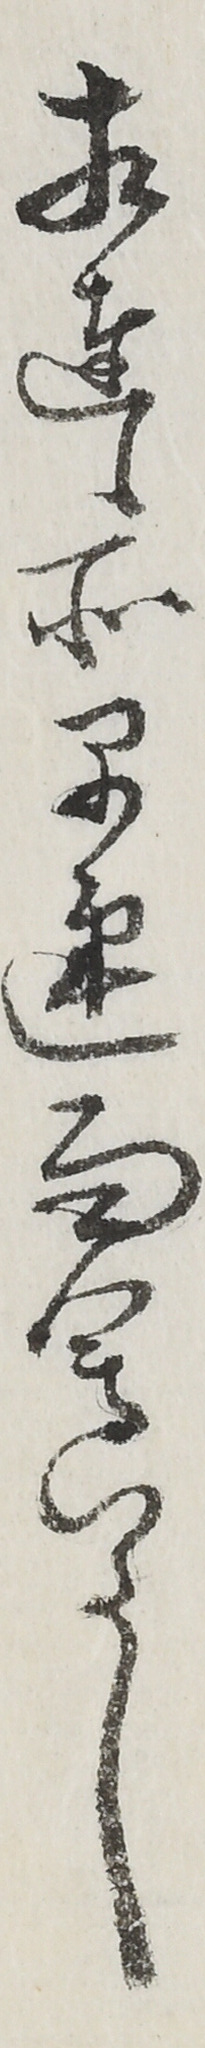相達候所早速面会いたし
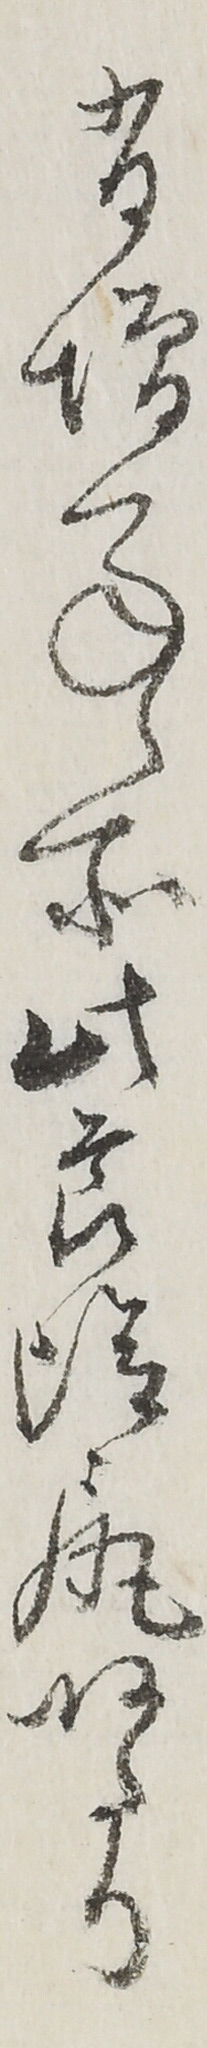有増事候所此節塩尻いたり
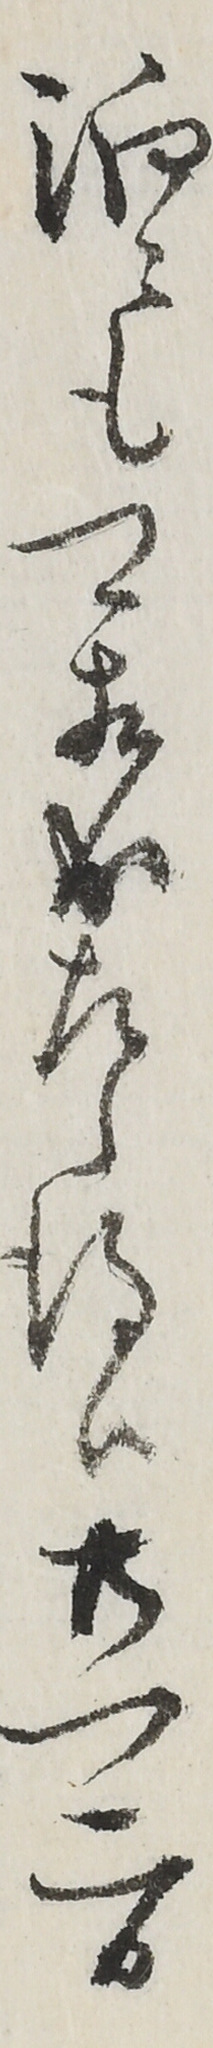泊ニも可相成左候得ハ廿一二日
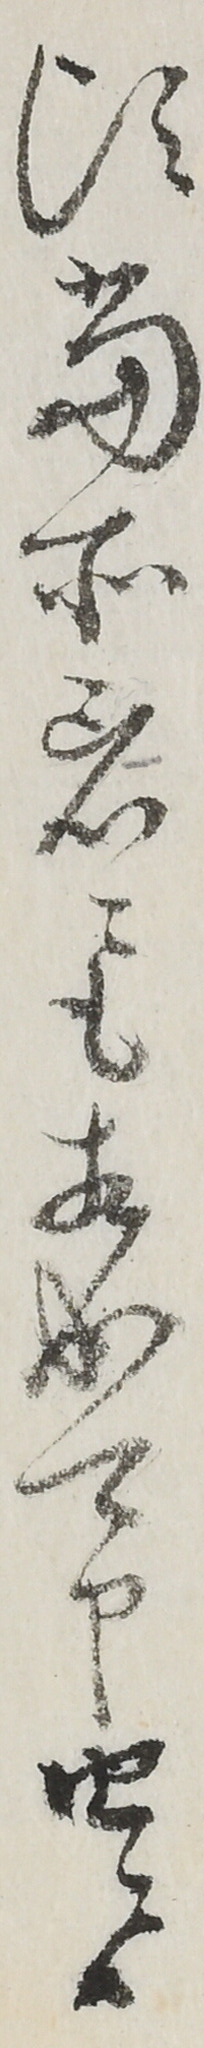頃当所着ニも相成可申由ニ而
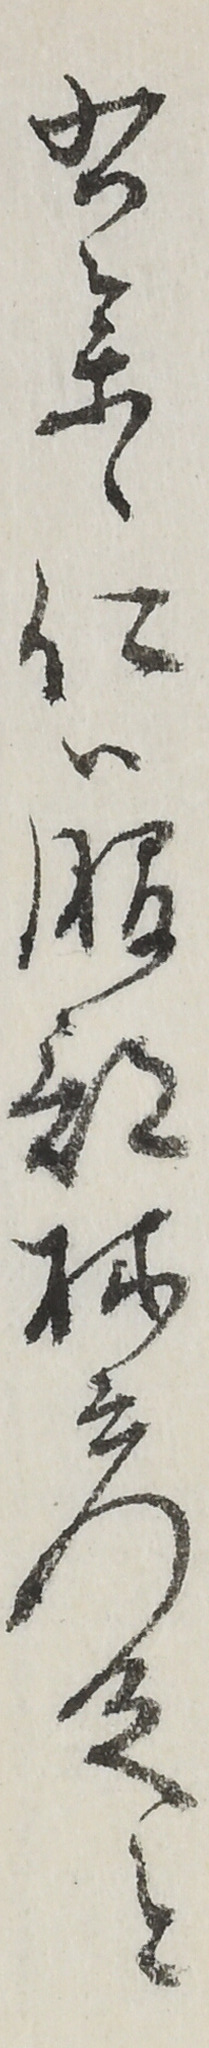右参候仕ハ服部林衛門殿と
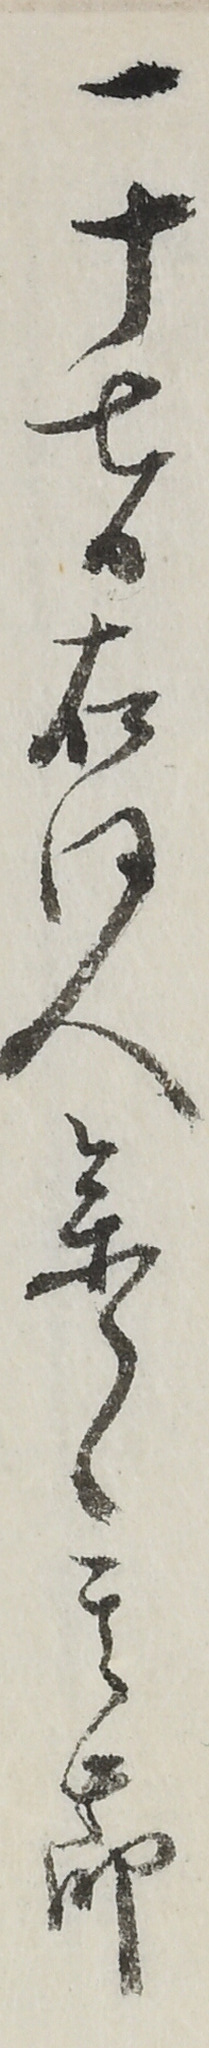一十七日右同人参リ候其節
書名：山田大路御炊太夫様御泊諸事控
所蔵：伊那市立高遠町図書館・合同会社AMANE
